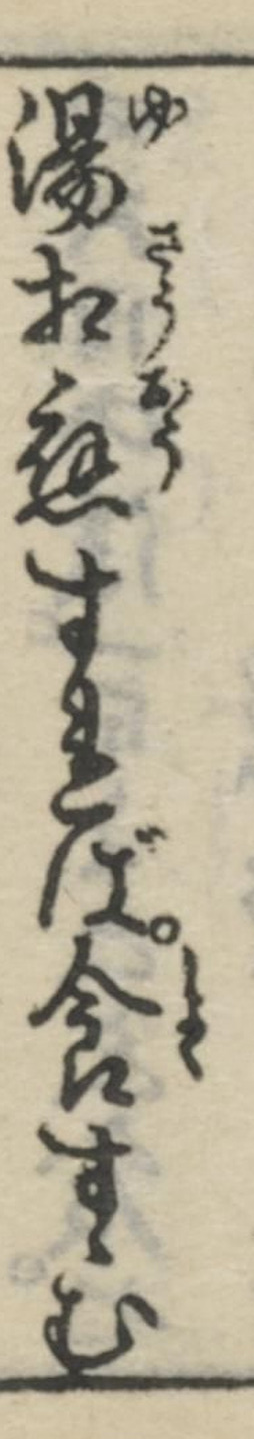湯相応すれば。食すゝむ
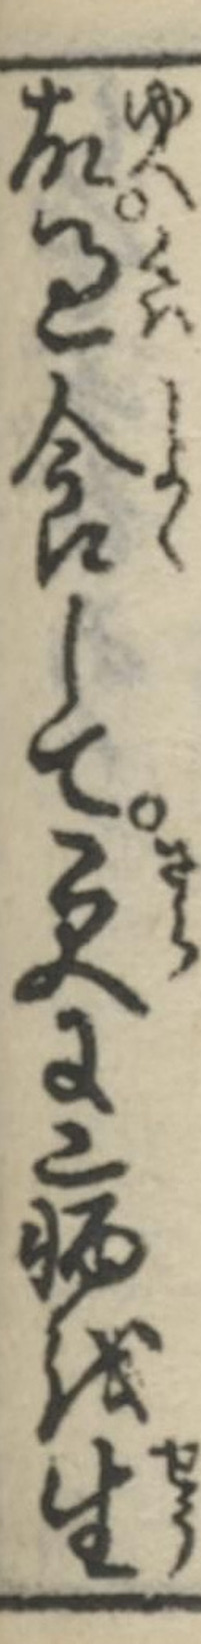故。過食して。更に病を生
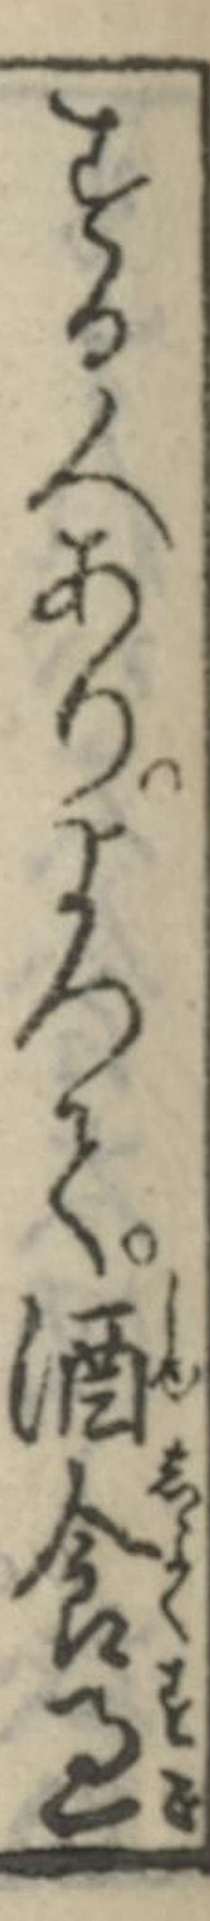する人あり。よつて。酒食過
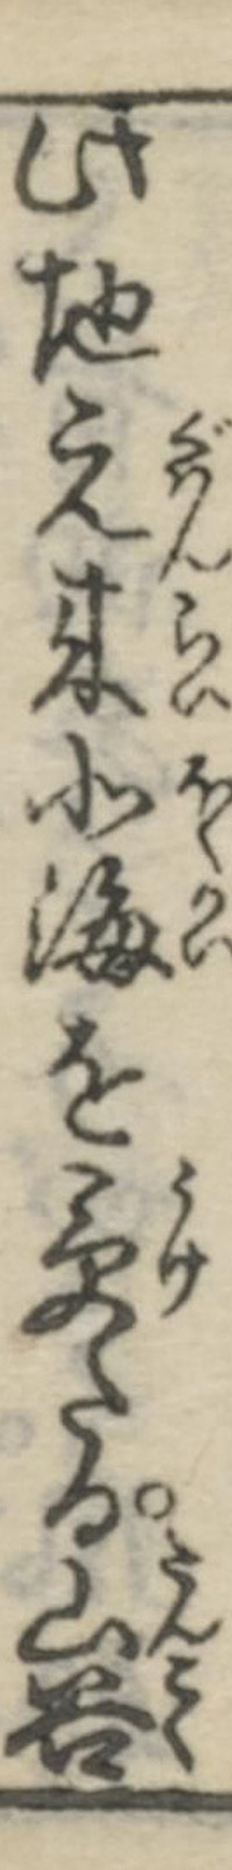此地元来北海を受たる。山谷
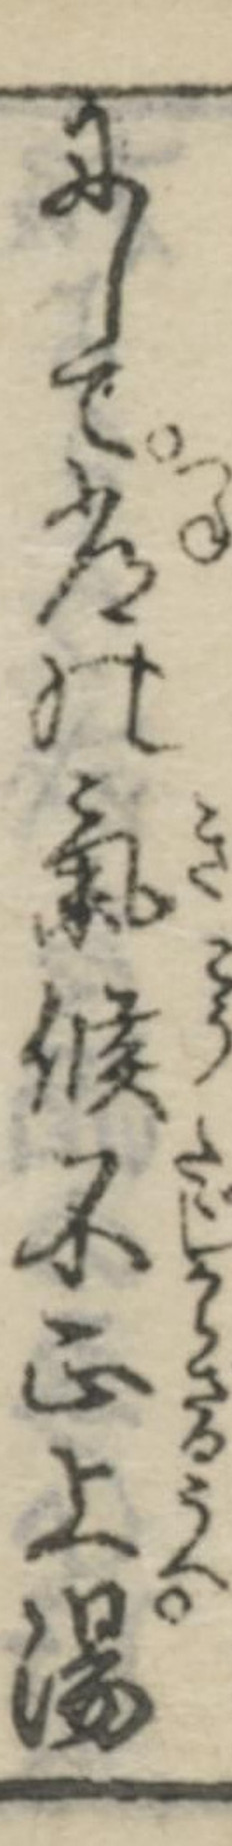にして。常の気候不正上。湯
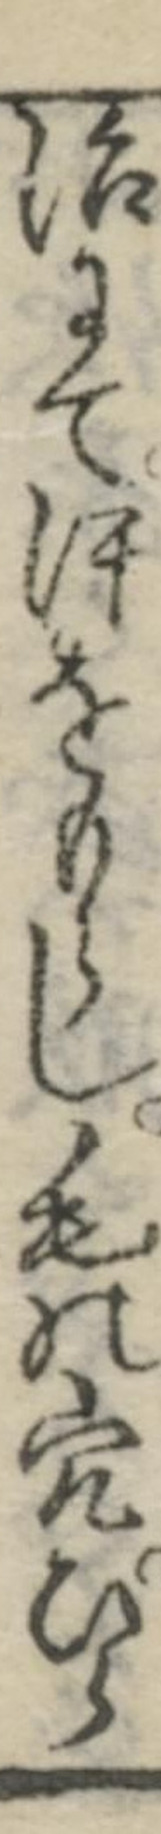治にて。汗をもらし。毛の穴。ひら
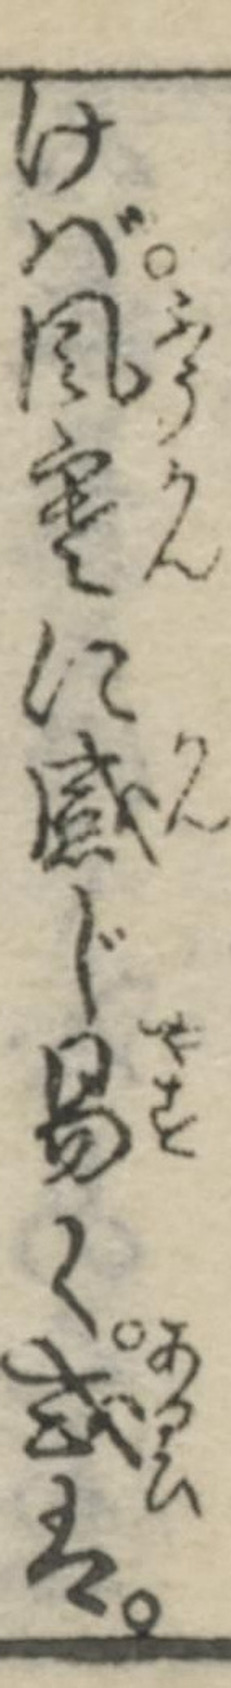けば。風寒に感じ易く。或は。
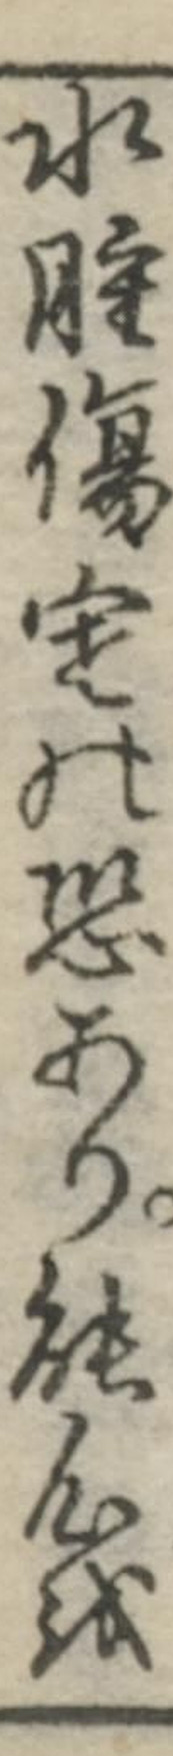水腫傷寒の恐あり。能心を
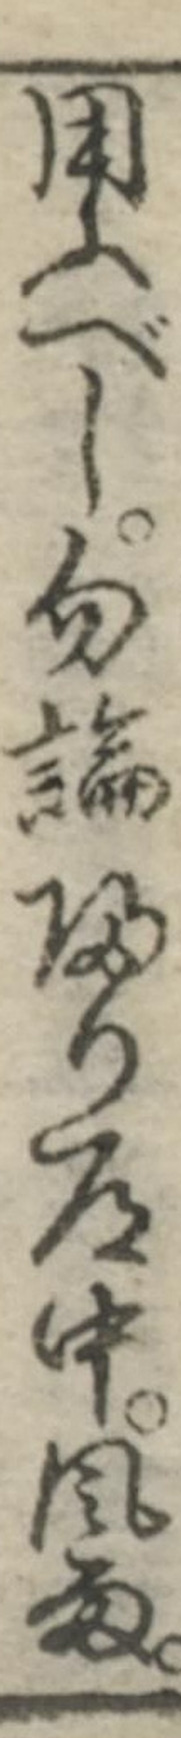用ふべし。勿論帰り道中。風雨。
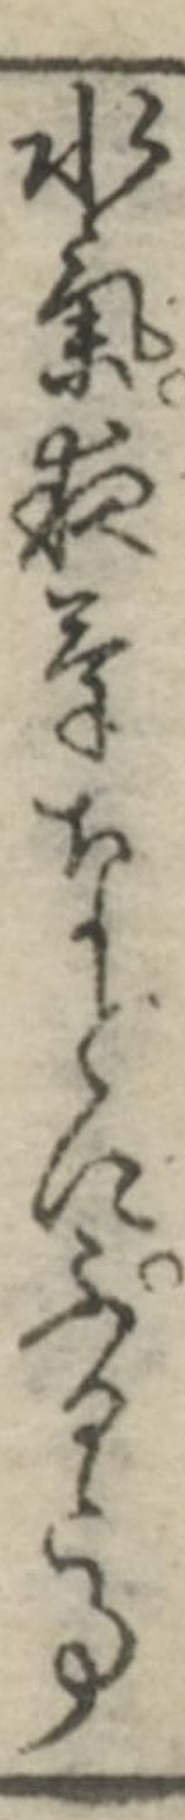水気。夜気などに。ふるゝ事
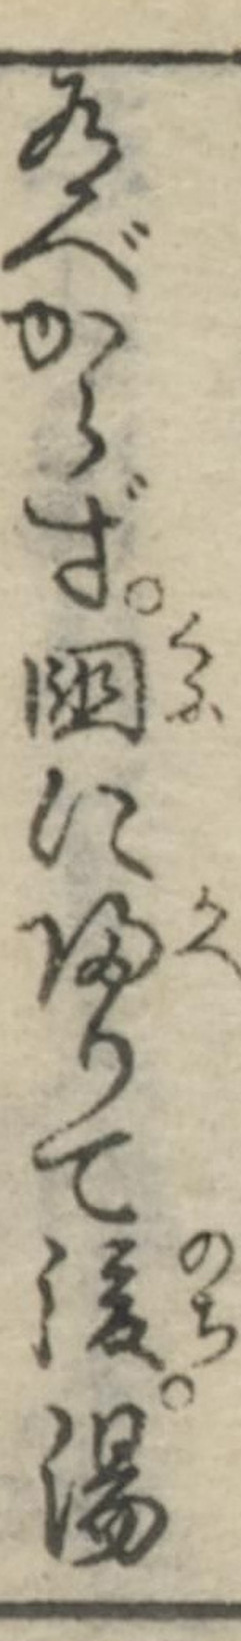有べからず。国に帰りて後。湯
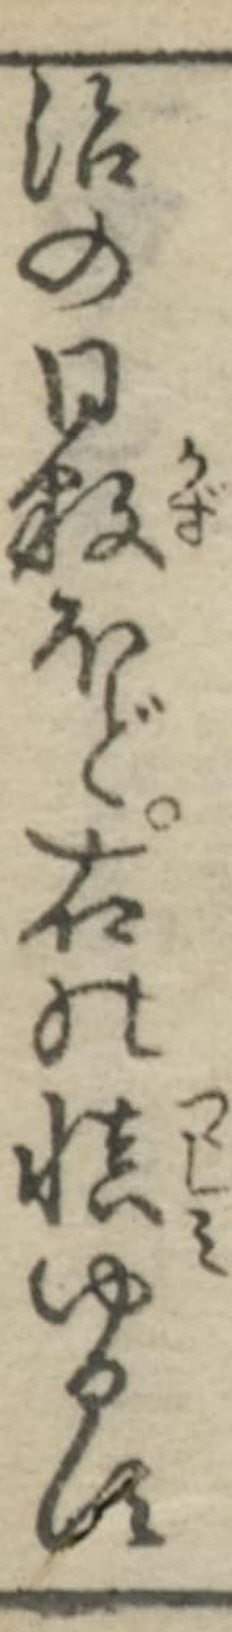治の日数ほど。右の慎ゆるす

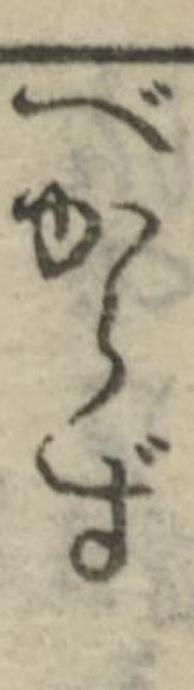べからず
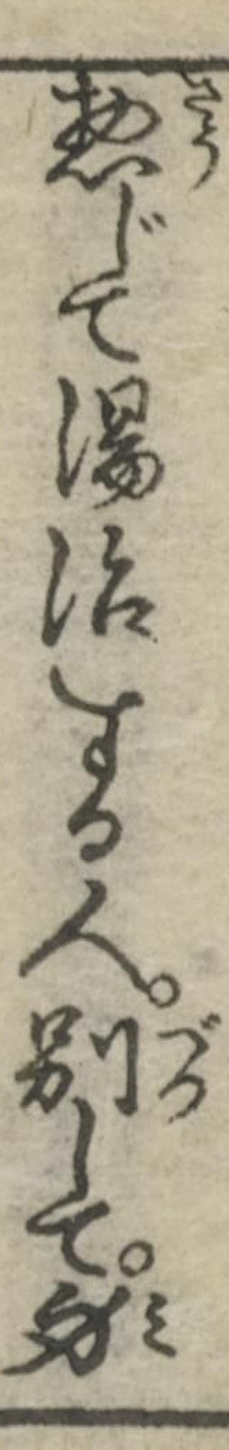惣じて湯治する人。別して。身
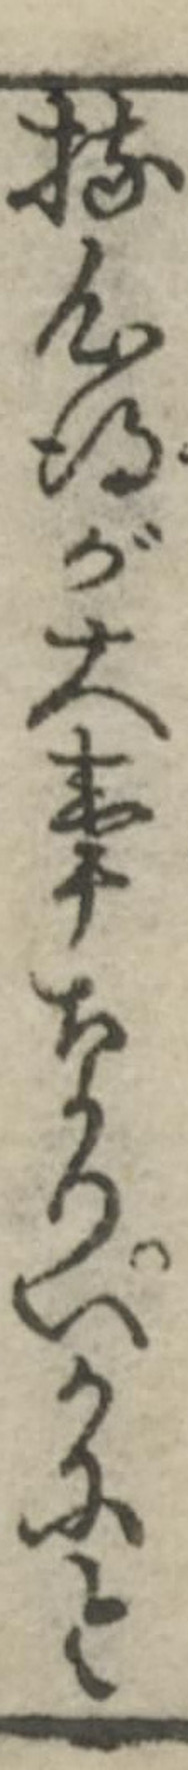持心得が大事なり。いかにと
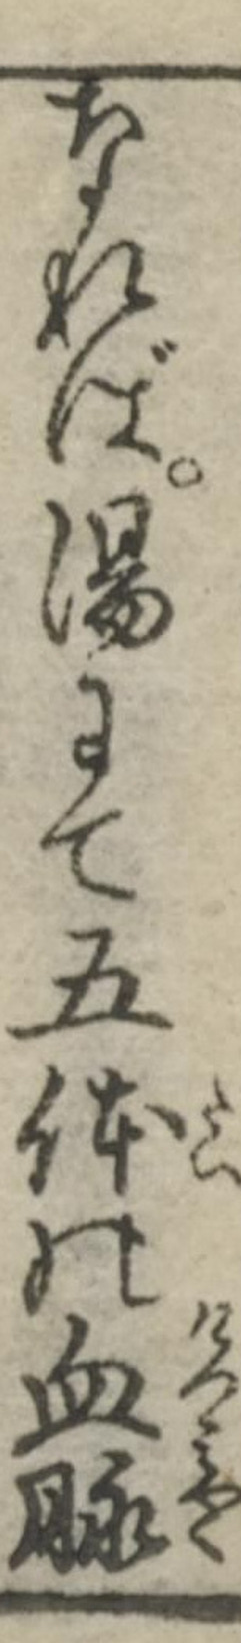なれば。湯にて五体の血脈
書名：但州城崎浴湯辧
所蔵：東京大学地震研究所図書室 Earthquake Research Institute Library, The University of Tokyo, JAPAN
